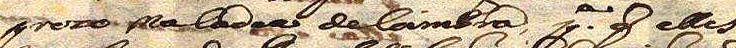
prezo na cadea de Coimbra, pa. q̄ elles
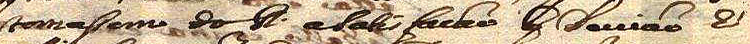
tomassem do R. a satisfação q̄ deuião E
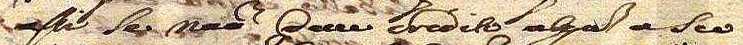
assi se naõ deue credito algū a seo
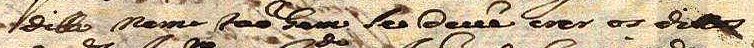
ditto nem taõbem se deuē crer os dittos
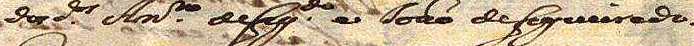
dos d.os An.to de fig.do e Ioão de figueiredo.
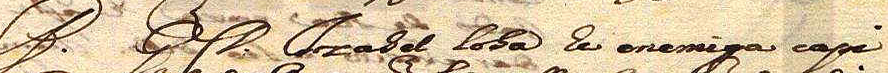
P. Q̄ D. Izabel Loba he enemiga capi
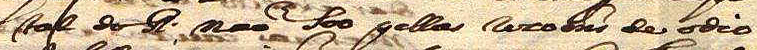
tal do R. naõ soo pellas rezoens de odio
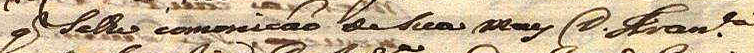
q̄ se lhe comonicão de sua may D. Fran.ca
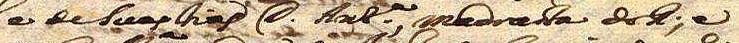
e de suas tias D. Ant.a, madrasta do R., e
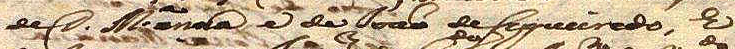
de D. M.a anna e de Ioão de figueiredo, E
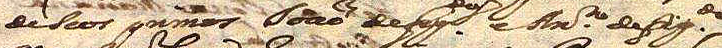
de seos primos Ioaõ de fig.do e An.to de fig.do
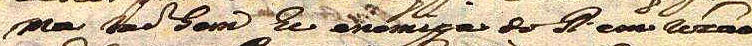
ma taõbem he enemiga do R. em rezão
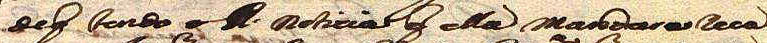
de q̄ tendo o R. noticia q̄ ella mandara reca
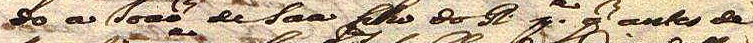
do a Ioaõ de Saa filho do R. pa. q̄ antes de
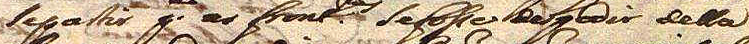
se partir p.a as front.ras se fosse despedir della
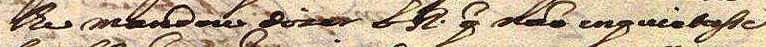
lhe mandou dizer o R. q̄ não inquietasse
